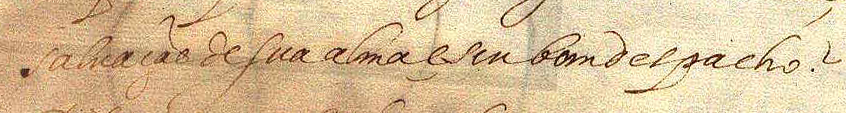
saluaçaõ de sua alma e seu bom despacho?
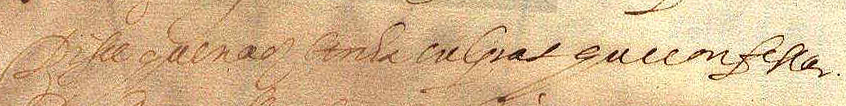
Disse que naõ tinha culpas que confessar
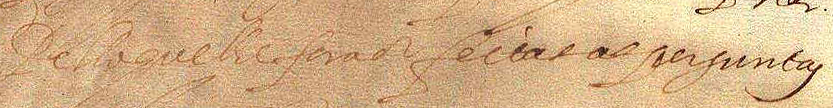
Pello que lhe foraõ feitas as perguntas
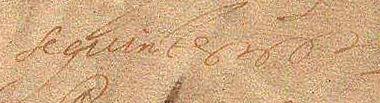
seguintes
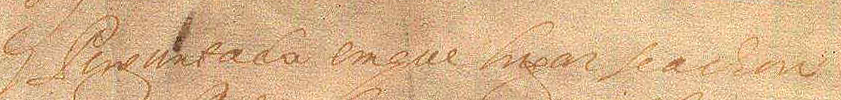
E Perguntada em que lugar se achou
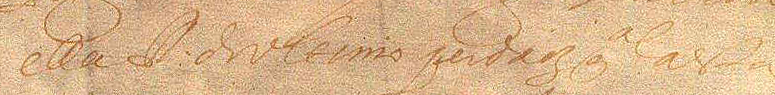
ella R. do vltimo perdaõ gal a esta
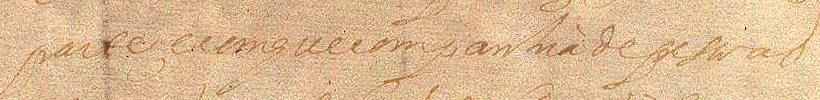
parte, e com que companhia de pessoas
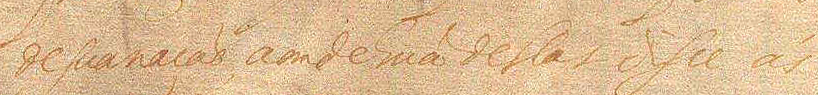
de sua naçaõ aomde huā dellas disse ás
